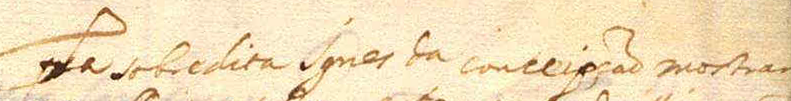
pla sobedita Ignes da conceipçaõ mostrar
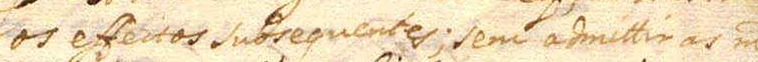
os effeitos subsequentes; sem admittir as m
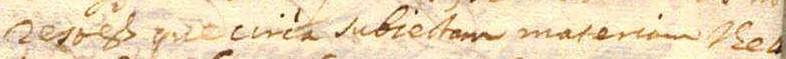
Resoẽs que circa subiectam materiam lhe
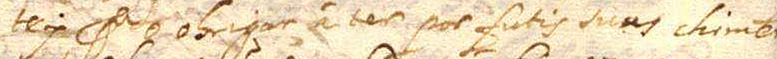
tey pa o obrigar á ter por futis suus chime
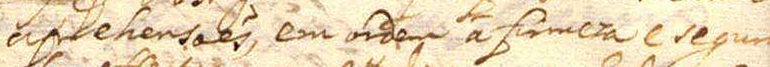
aprehensoẽs, em ordem à firmeza e segun
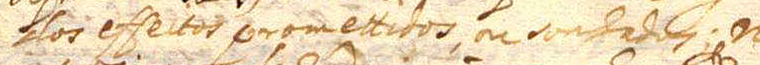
dos effeitos promettidos, ou sonhados; n
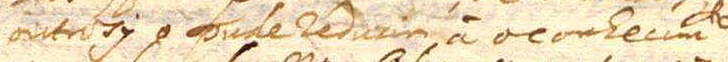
outrosy o pude Reduzir, ao conhecimto d
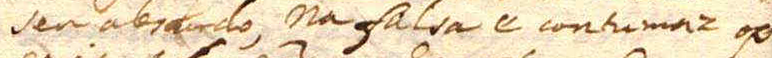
seu absurdo, na falsa e contumaz
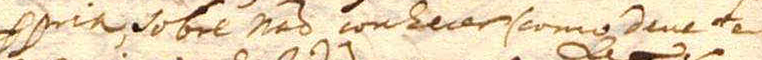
ꝓpria, sobre naõ conhecer (como deue e
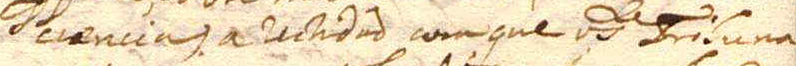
ciencia) a Rectidaõ com que o sto Tribuna
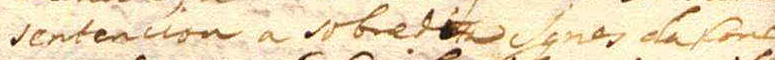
sentenciou a sobredita Ignes da Cons
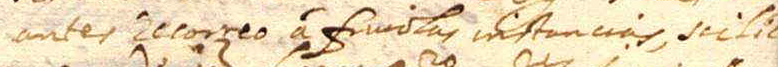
antes Recorreo a friuolas instancias, scilic
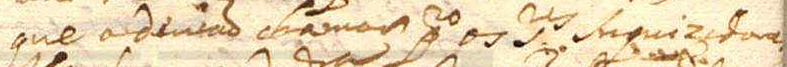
que a deuiaõ chamar pro os s.res Inquizidores
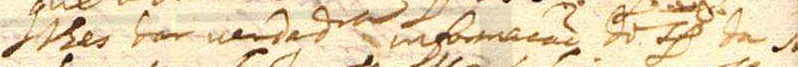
lhes dar uerdadra informaçaõ do spo da s
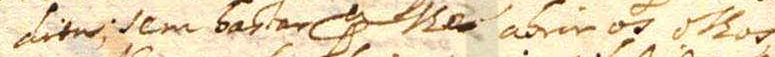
dita; sem bastar pa lhe abrir os olhos
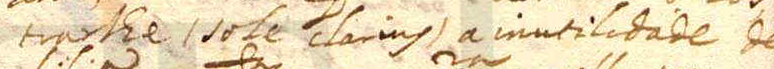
trarlhe (sole clarius) a inutilidade de
